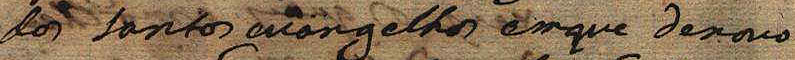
dos santos euangelhos em que de nouo
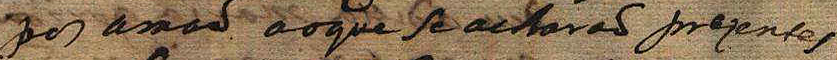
pos a maõ ao que se acharaõ prezentes
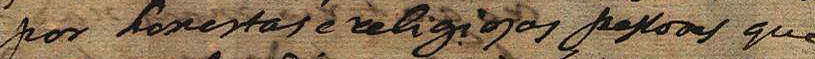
por honestas e religiozas pessoas que
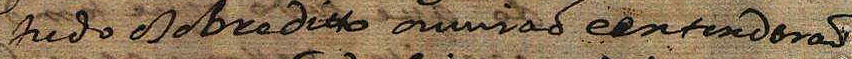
tudo o sobreditto ouuiraõ e entenderaõ
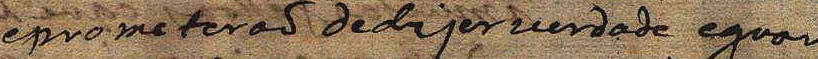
e prometeraõ de dizer uerdade e guar
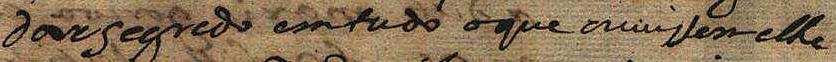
dar segredo em tudo o que ouuissem e lhe
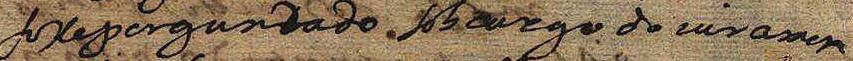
fosse perguntado sob cargo do iuramen
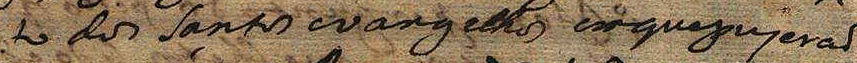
to dos santos evangelhos em que puzeraõ
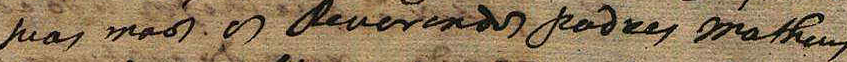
suas maõs os Reuerendos padres matheus
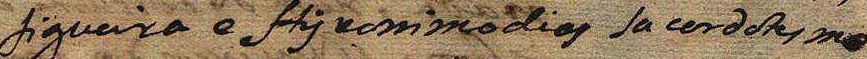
figueira e Hyronimo dias sacerdotes mo
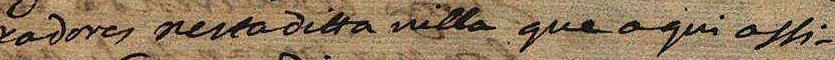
radores nesta ditta uilla que aqui assi
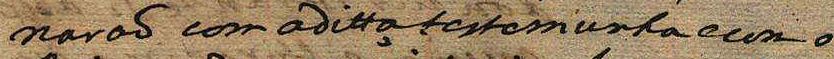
naraõ com a ditta testemunha e com o
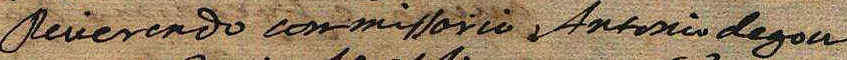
Reuerendo commissario Antonio de gou
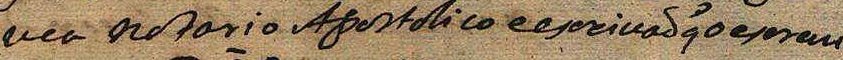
uea notario Apostolico e escriuaõ q̄ o escreui
